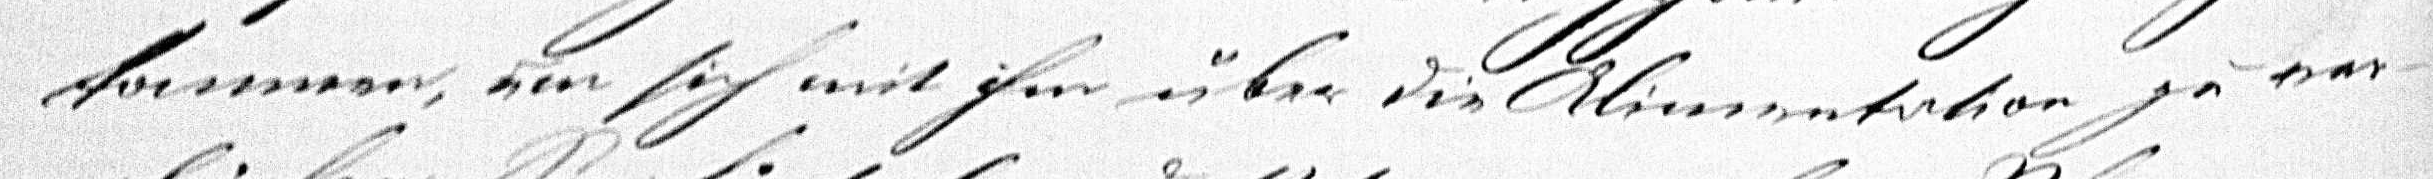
kommen, um sich mit ihm über die Alimentation zu ver¬
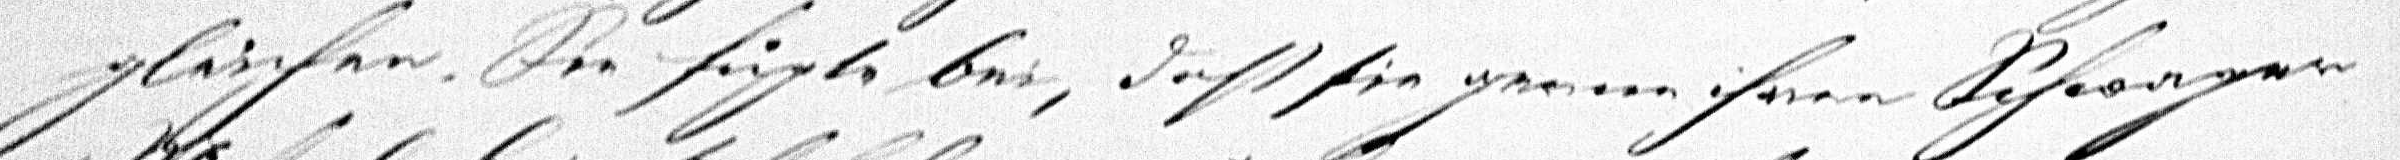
gleichen Sie fügte bei, das sie gerne ihren Schwager
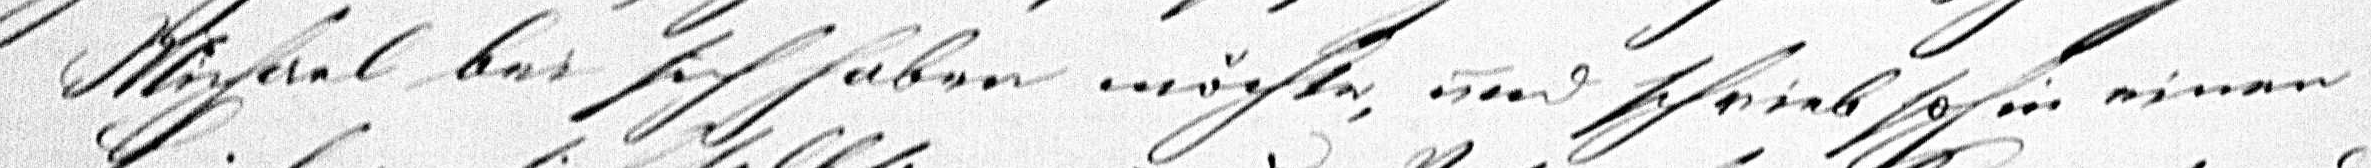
Michael bei sich haben möchte, und schrieb so in einen
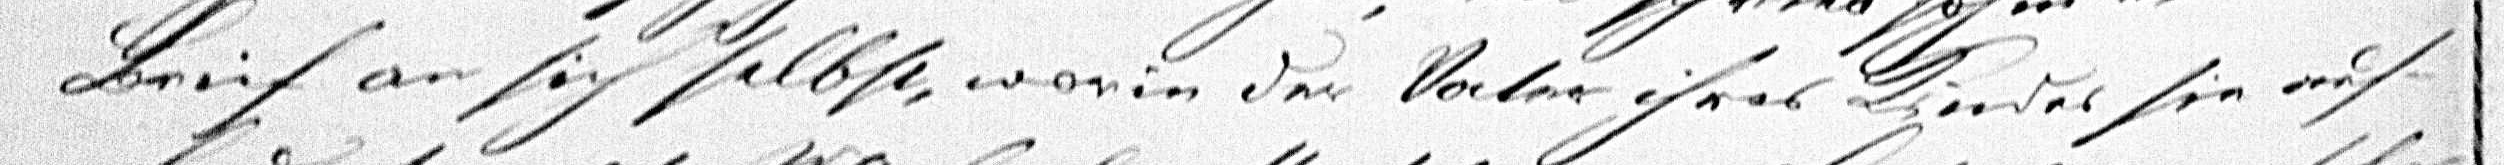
Brief an sich selbst, worin der Vater ihres Kindes sie auf¬
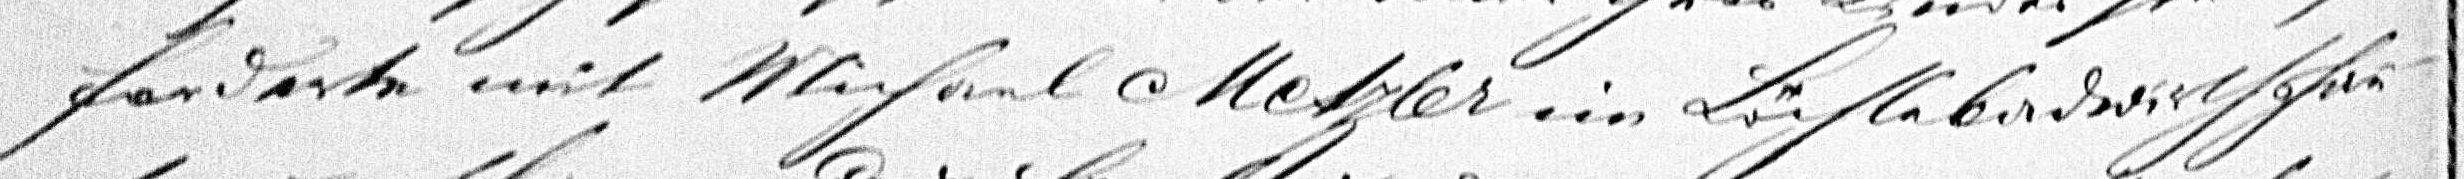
forderte mit Michael Metzler im Löchtebadwirthshau¬
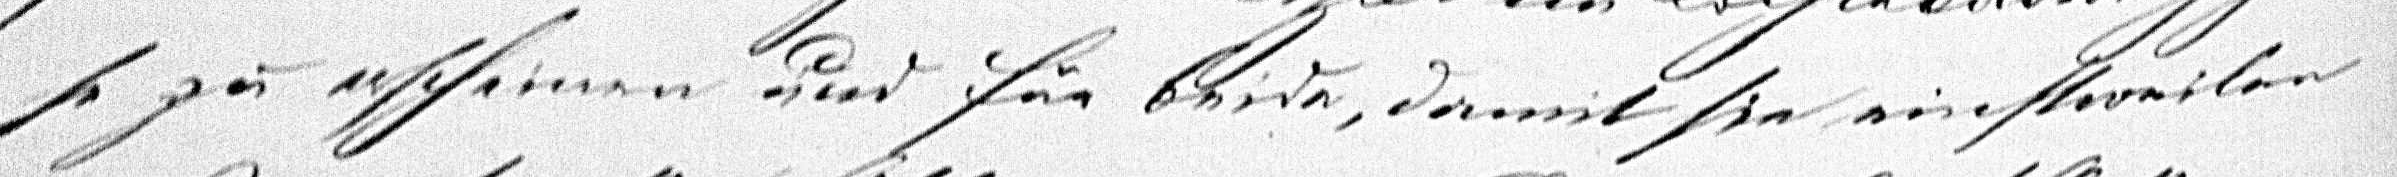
se zu erscheinen und für beide, damit sie einstweilen
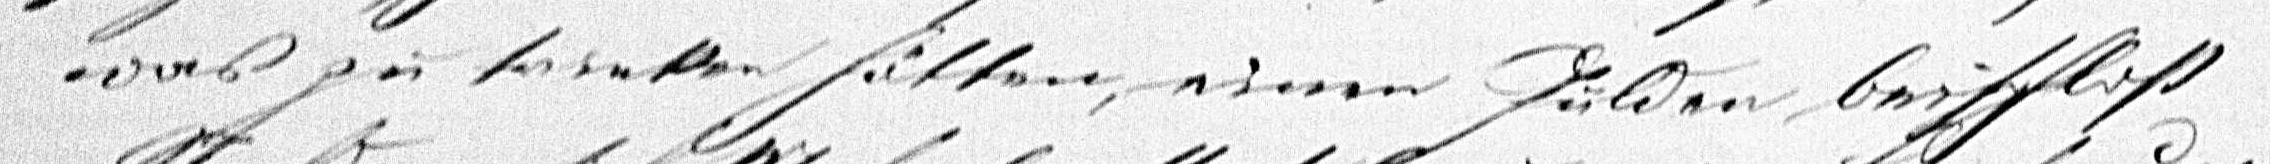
was zu trinken hätten, einen Gulden beischloß.
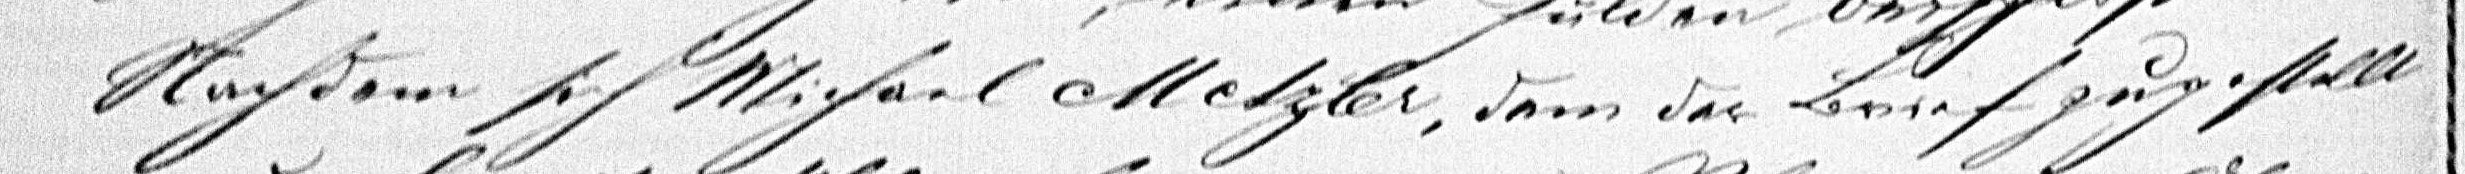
Nachdem sich Michael Metzler, dem der Brief zugestellt
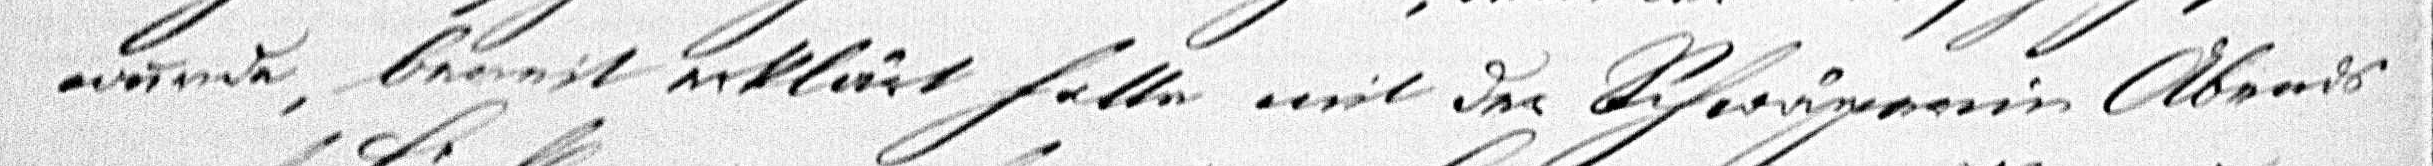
wurde, bereit erklärt hatte mit der Schwägerin Abends
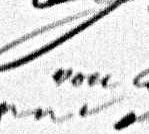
von
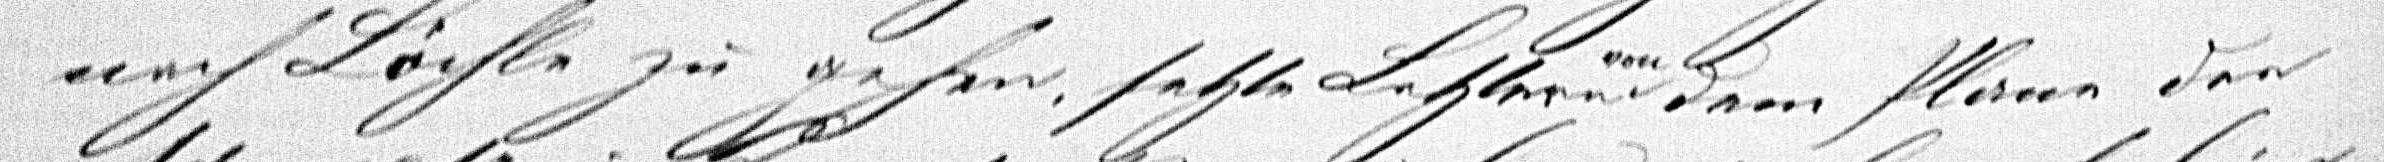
nach Löchte zu gehen, setzte Letztere dem Plane der
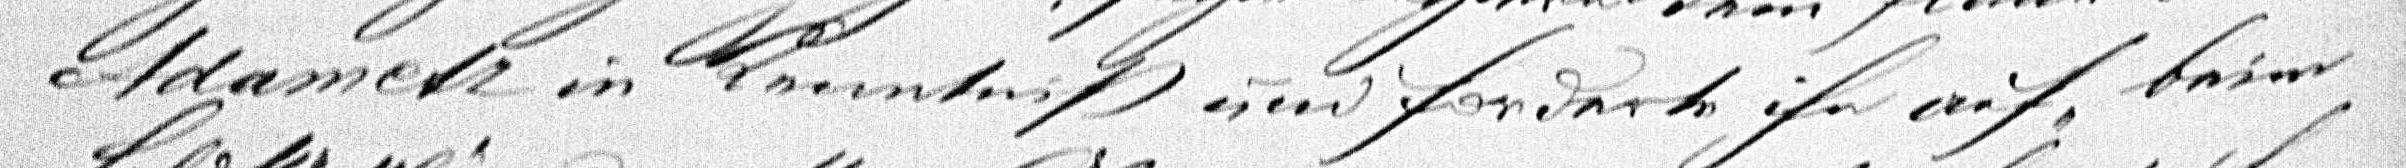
Adamek in Kenntniß und forderte ihn auf, beim
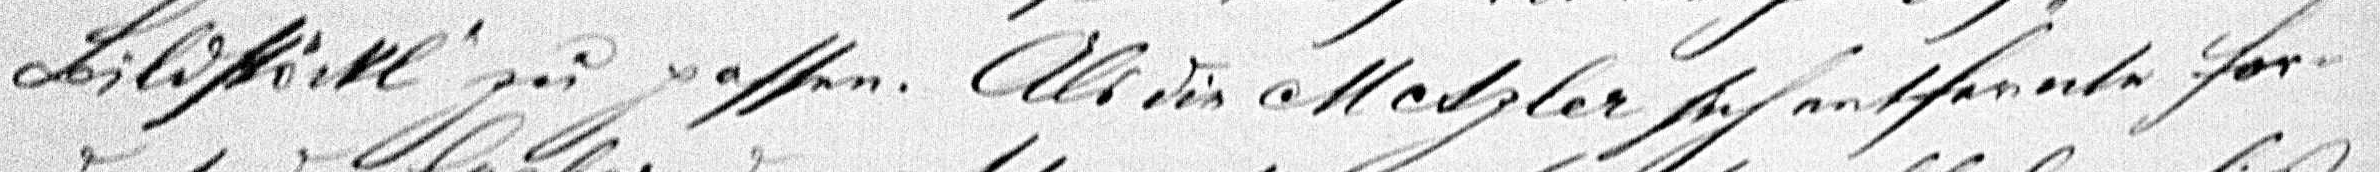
Bildstöckl zu passen. Als die Metzler sich entfernte for¬
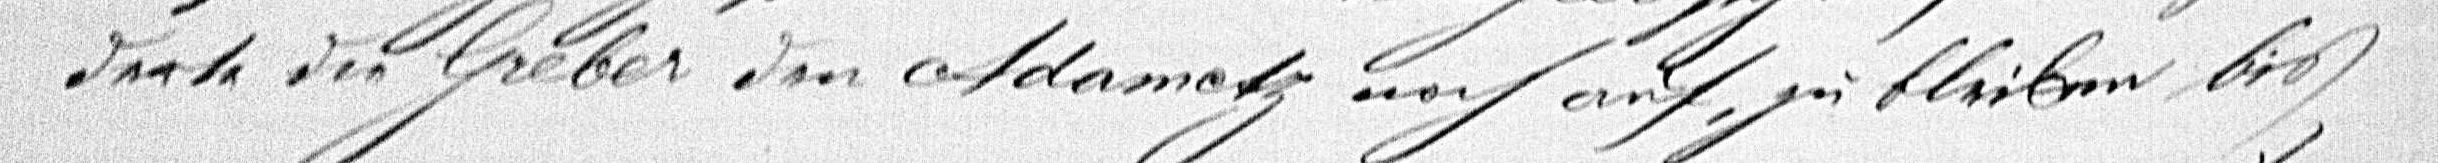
derte die Greber den Adametz noch auf, zu blieben bis
